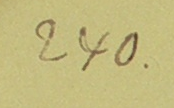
240
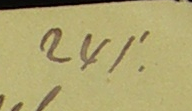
241
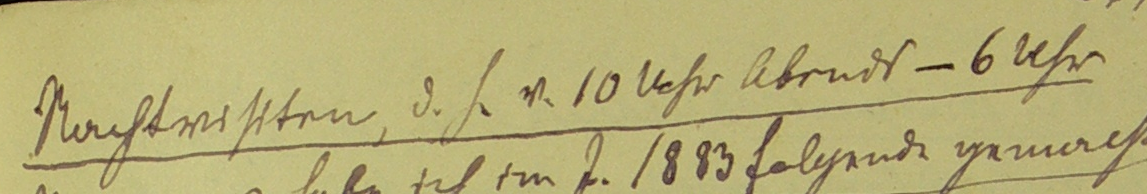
Nachtvisiten, u.s.w. 10 Uhr Abends—6 Uhr
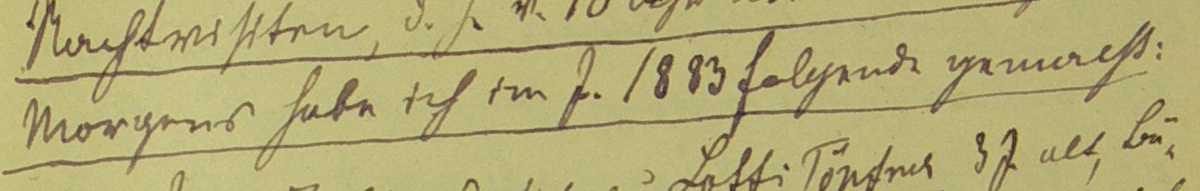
morgens habe ich im Jahre 1883 folgende gemacht:
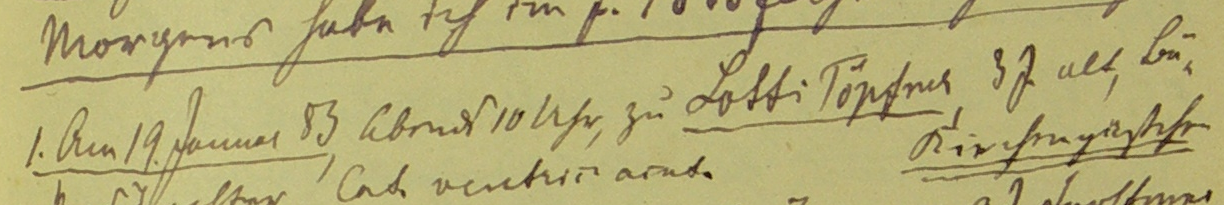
1. Am 19. Januar 83, Abends 10 Uhr, zu Lotti Töpfner, 3 J. alt, Bä¬
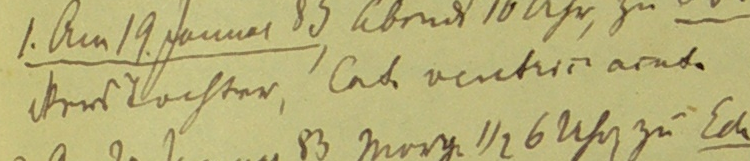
ckers Tochter, Cat. Venti acuta.
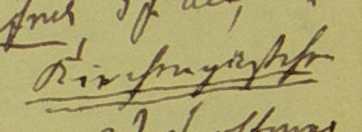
Kirchengäßchen
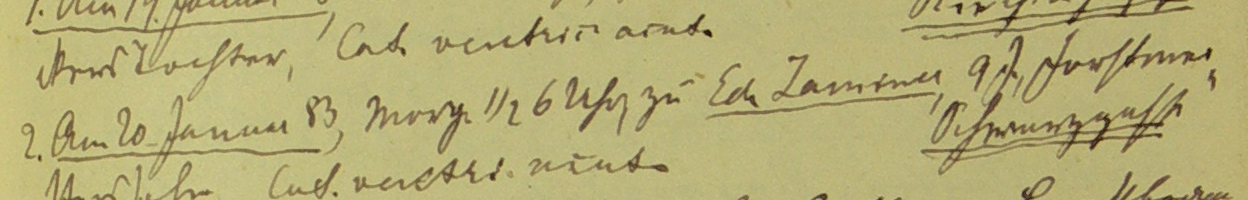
2. Am 20. Januar 83, Morgens ½ 6 Uhr zu Ed. Taminer, 9 J., Forstmei¬
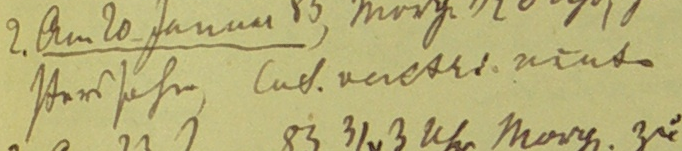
ster Sohn, Cat. Venti acuta
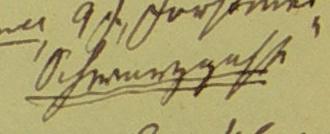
Schwarzgasse
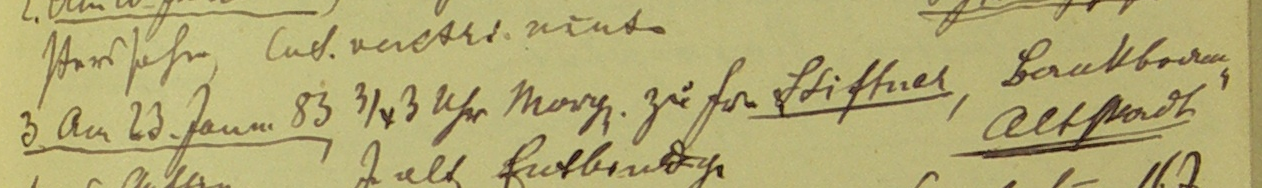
3. Am 23 Januar 83, ¾ 3 Uhr Morg. Zu Fr. Stifter, Bankbam¬
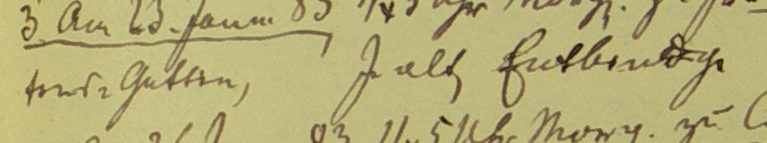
ten Gattin, J. alt Entbindung ,
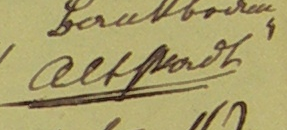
Altstadt
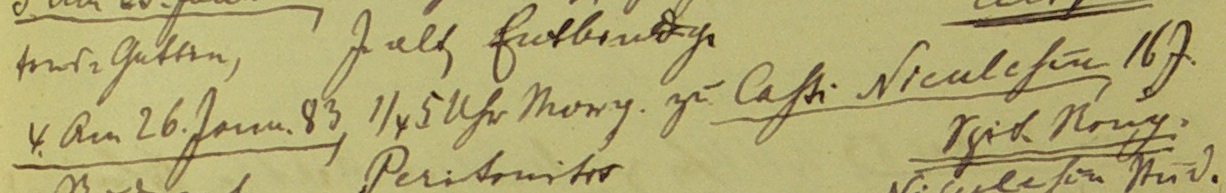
4. Am 26. Januar 83., ¼ 5 Uhr Morg. Zu Casti Niculefin, 16 J.
